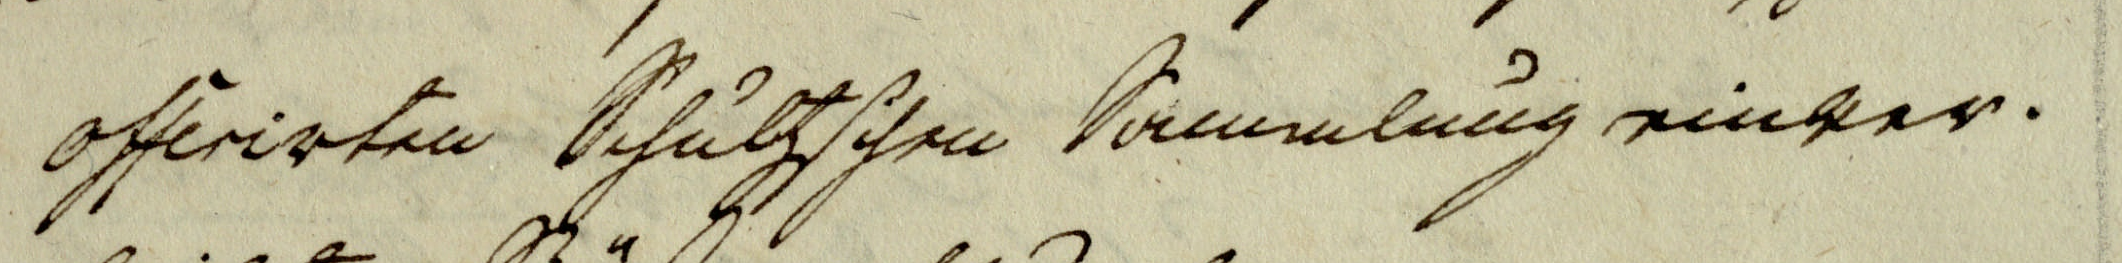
offerirten Schultzschen Sammlung einver¬
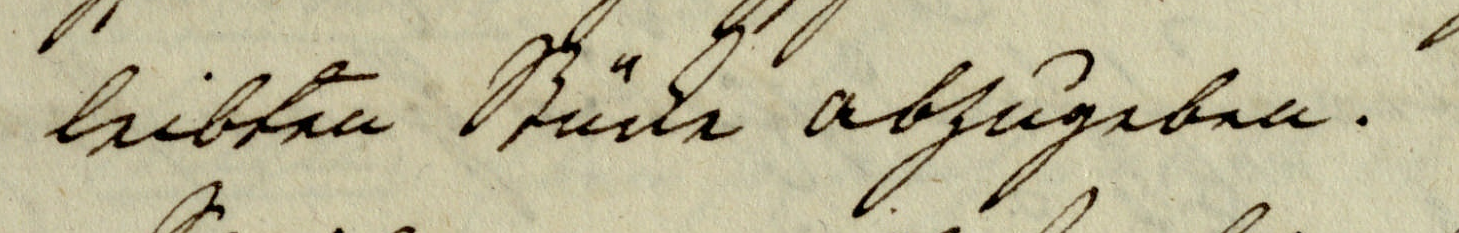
leibten Stücke abzugeben.
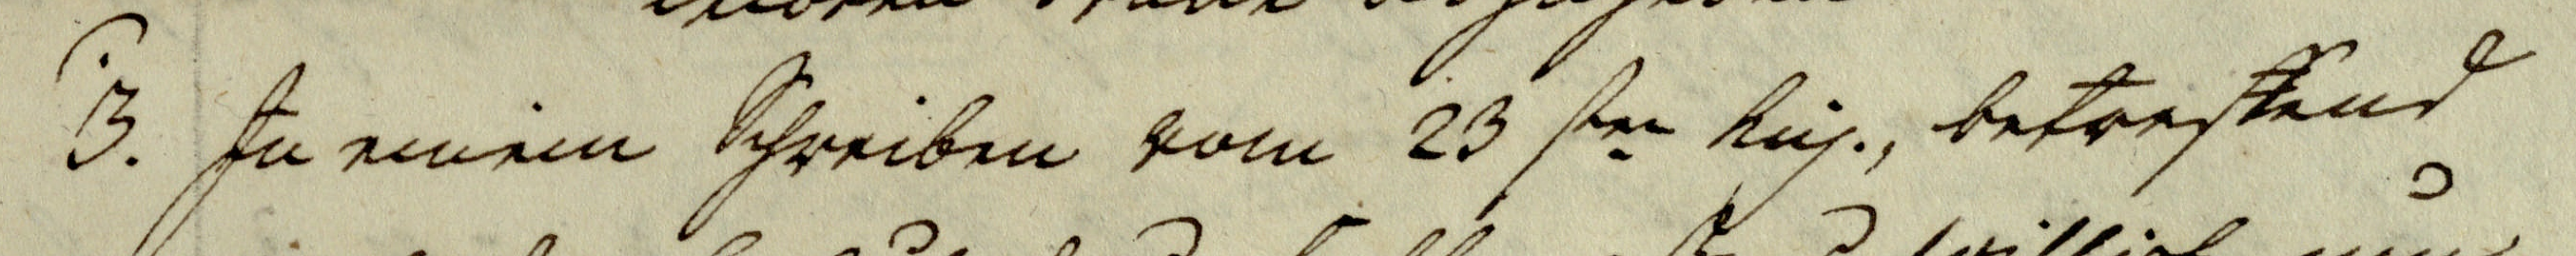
3. In einem Schreiben vom 23 sten huj., betreffend
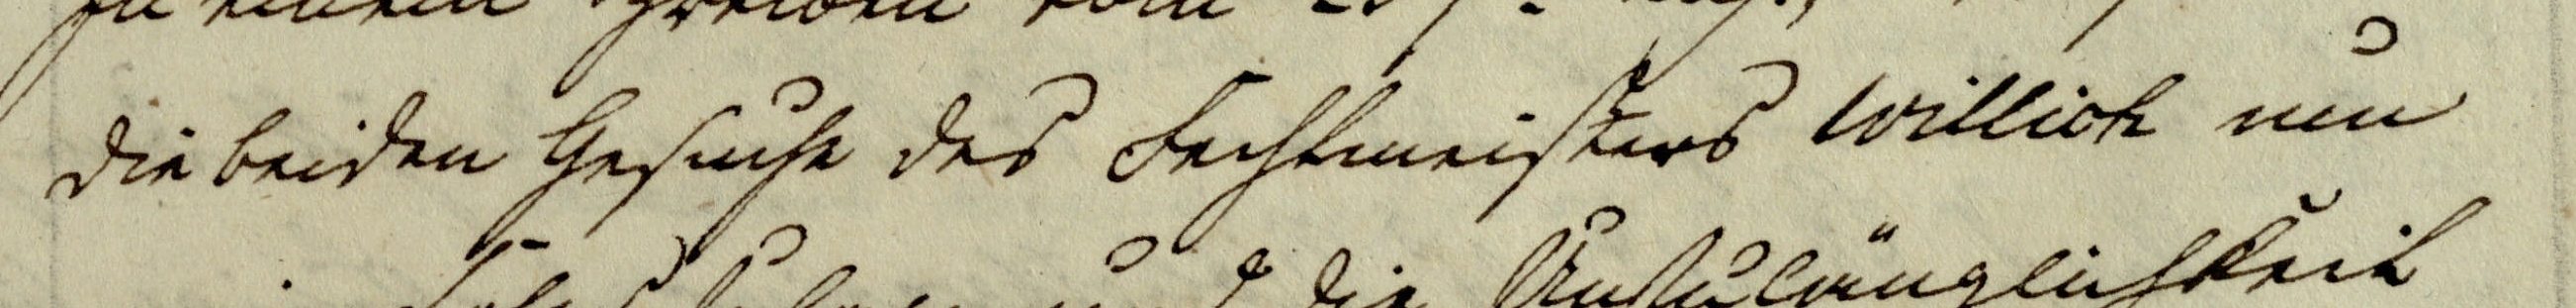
die beiden Gesuche des Fechtmeisters Willich um
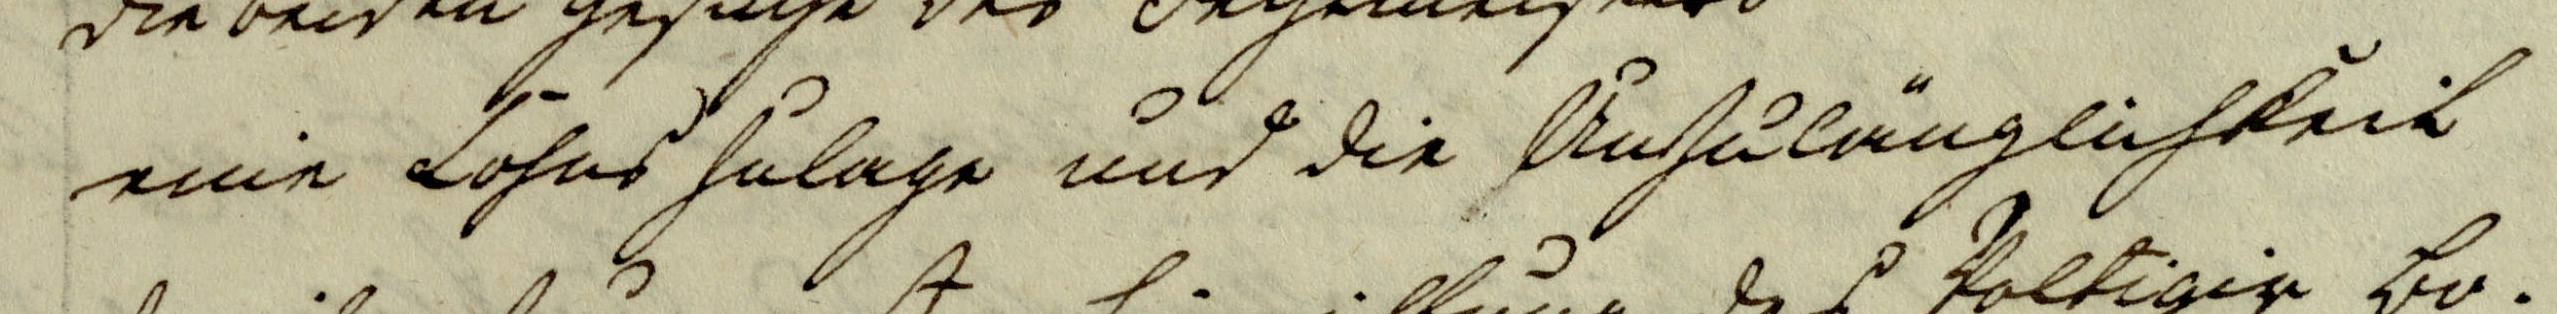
eine Lohns Zulage und die Anzulänglichkeit
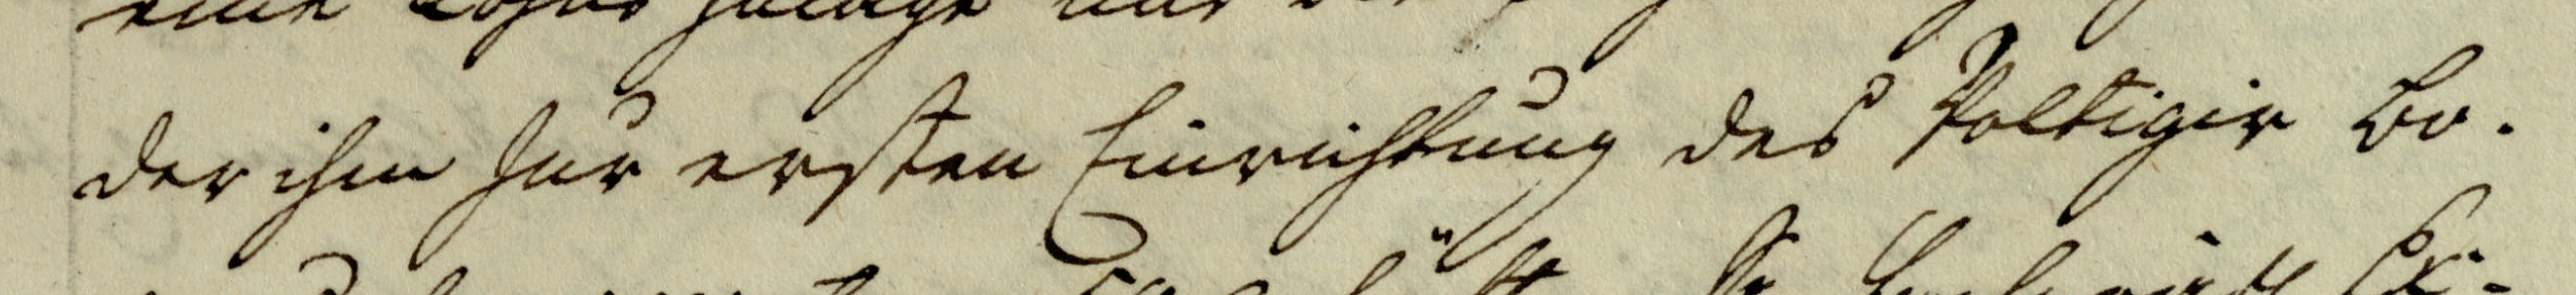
der ihm zur ersten Einrichtung des Voltigir Bo¬
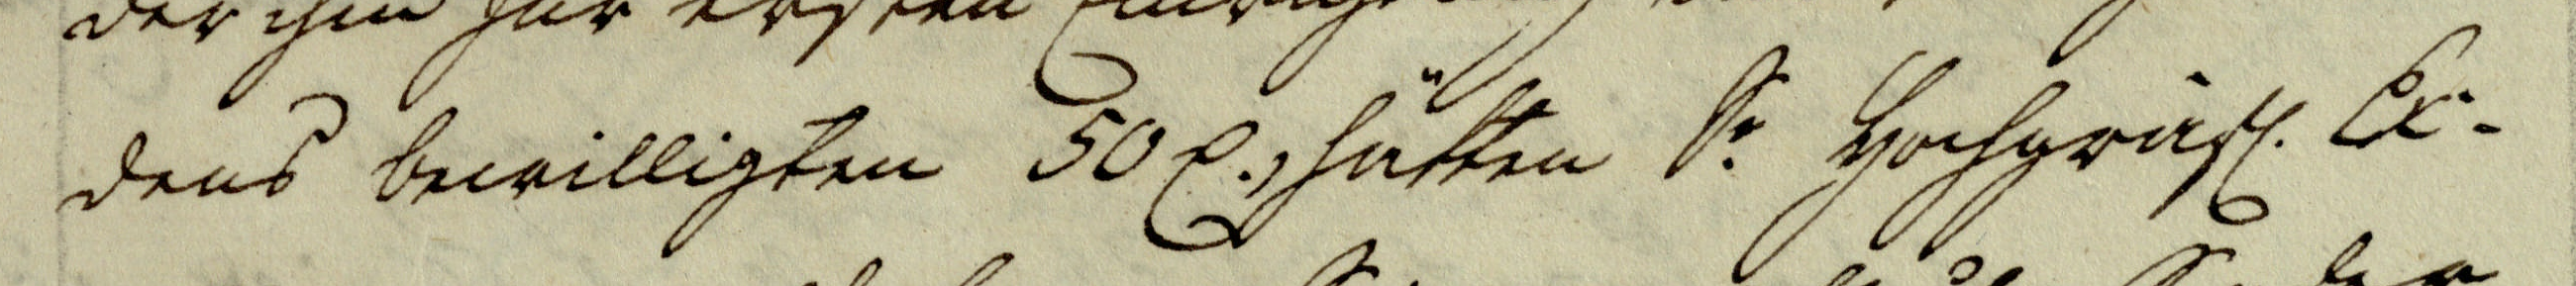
dens bewilligten 50 l., hätten Sr Hochgräfl. Ex¬
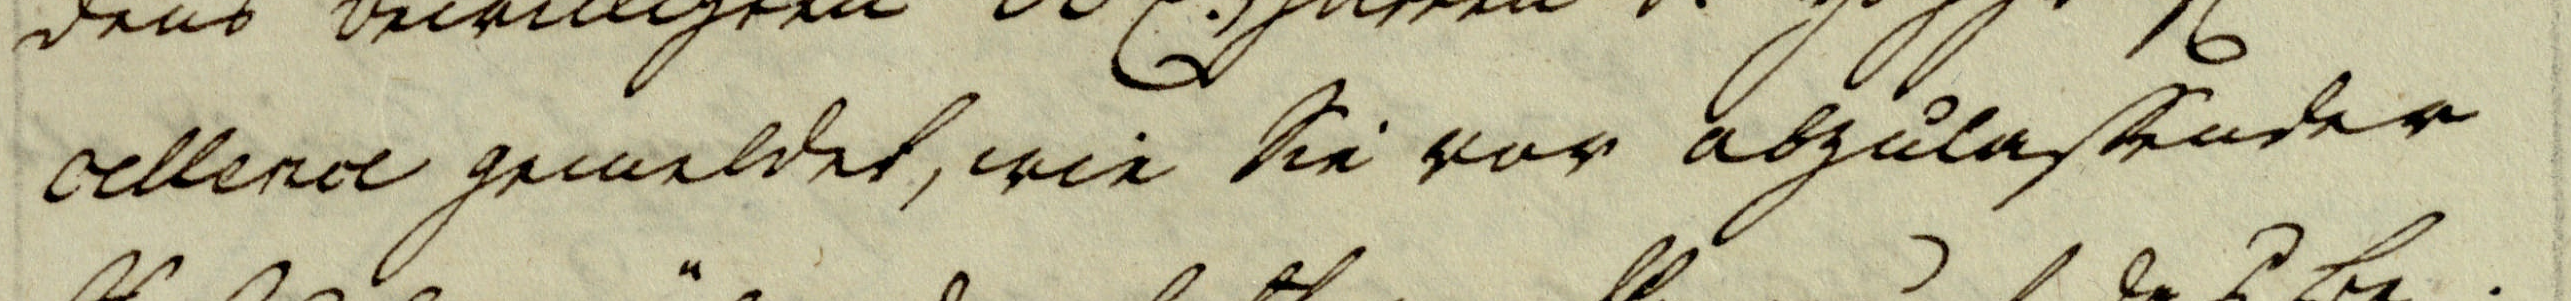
cellence gemeldet, wie Sie vor abzulassender
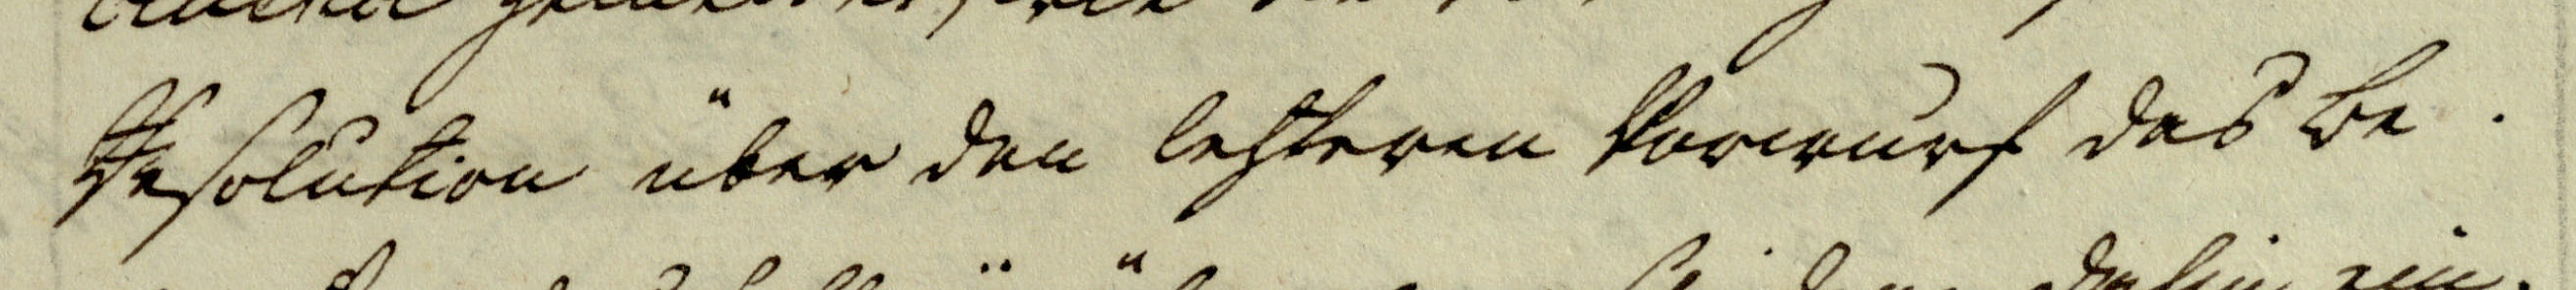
Resolution über den letzteren Vorwurf das Be¬
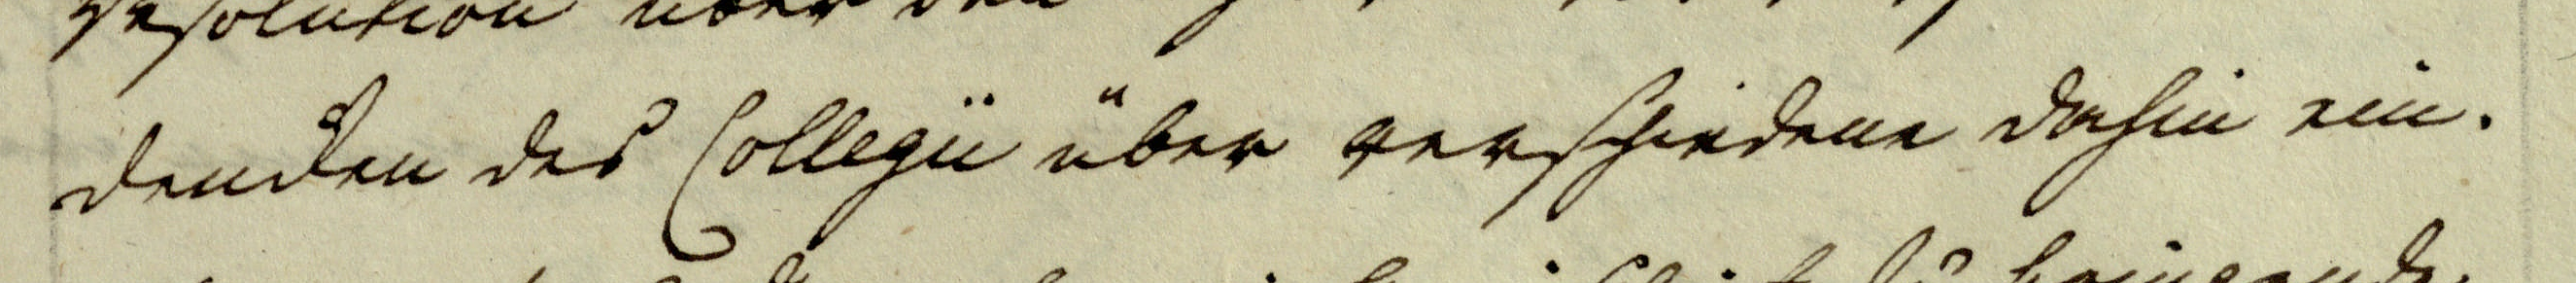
dencken des Collegii über verschiedene dahin ein¬
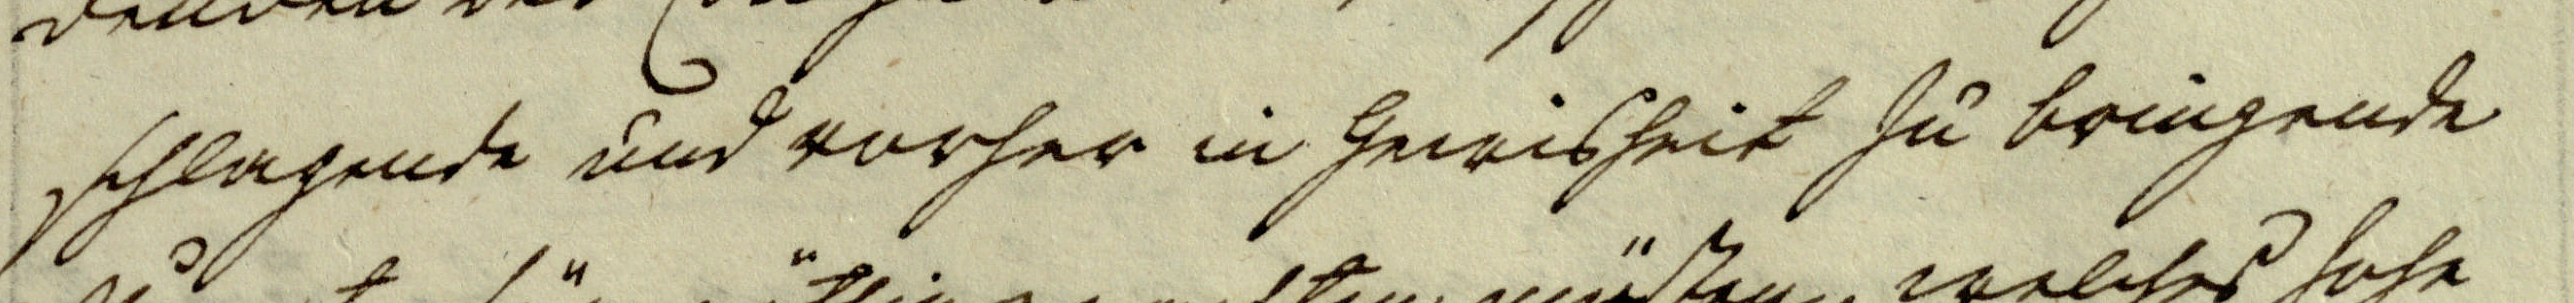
schlagende und vorher in Gewisheit zu bringenden
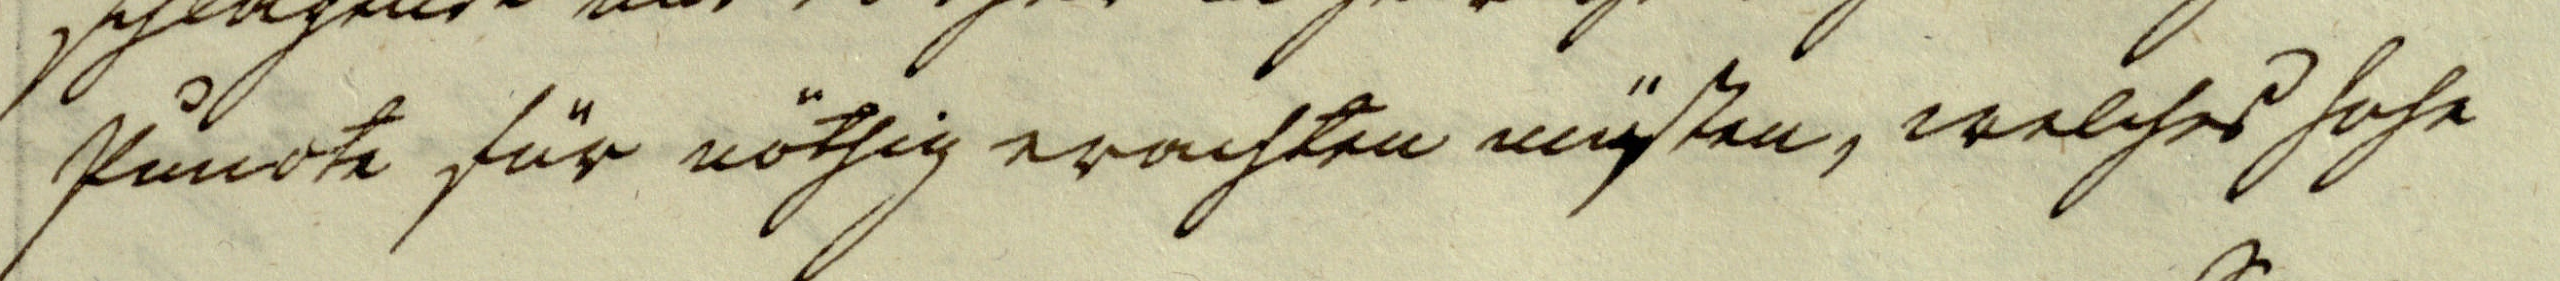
Puncte für nöthig erachten müßten, welches hohe
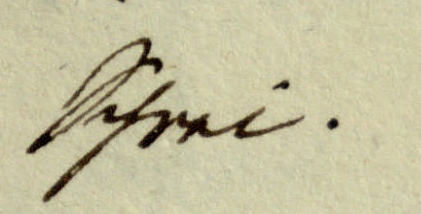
Schrei¬
